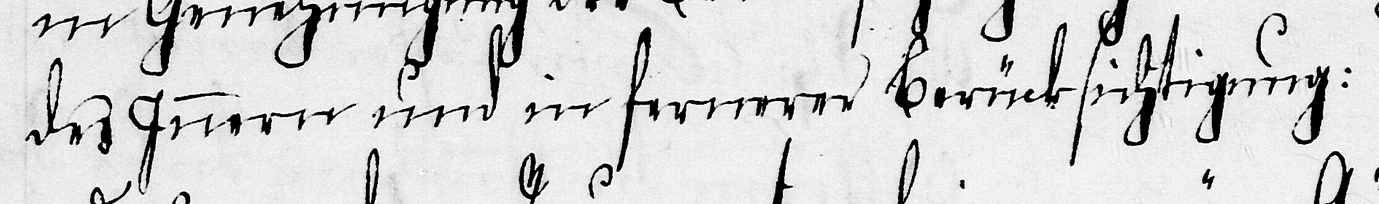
des Innern und in fernerer Berücksichtigung:
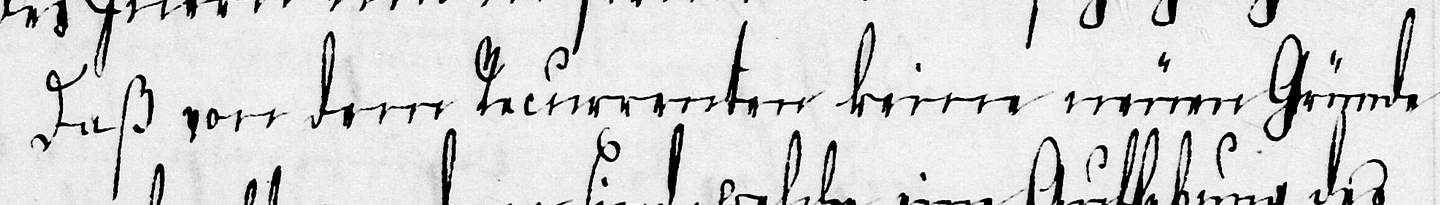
Daß von dem Recurrenten keine neuen Gründe
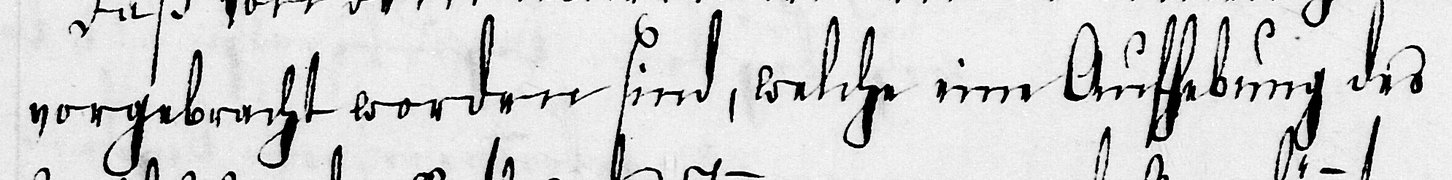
vorgebracht worden sind, welche eine Aufhebung des
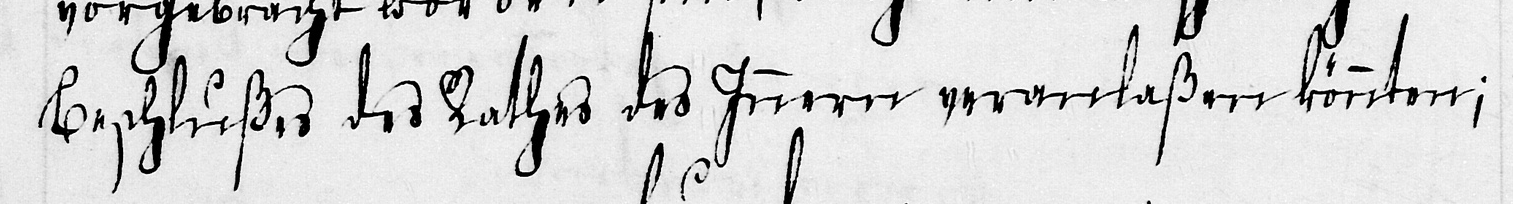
Beschlußes des Rathes des Innern veranlaßen könnten;
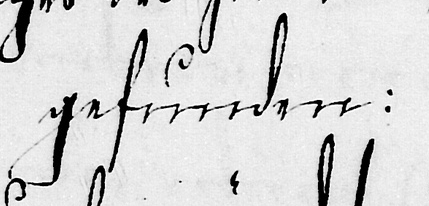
gefunden:
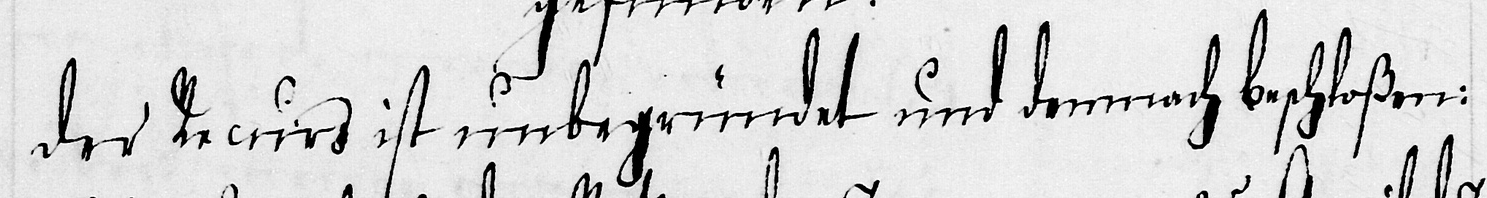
der Recurs ist unbegründet und demnach beschloßen:
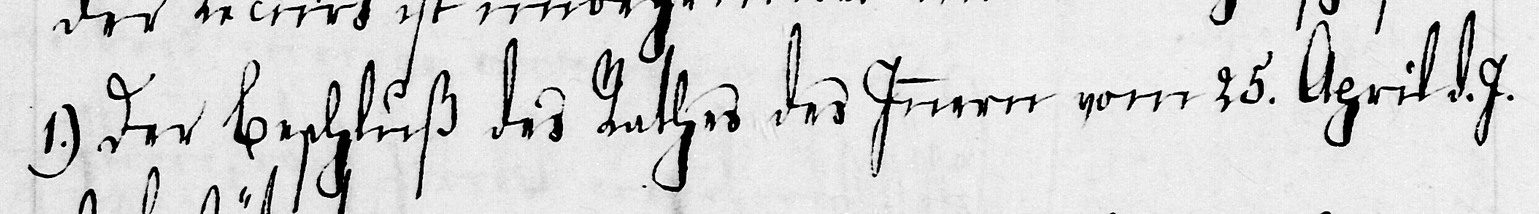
1.) Der Beschluß des Rathes des Innern vom 25. April d. J.
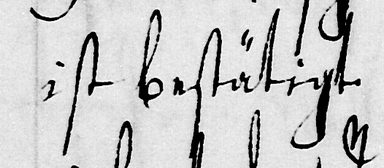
ist bestätigt.
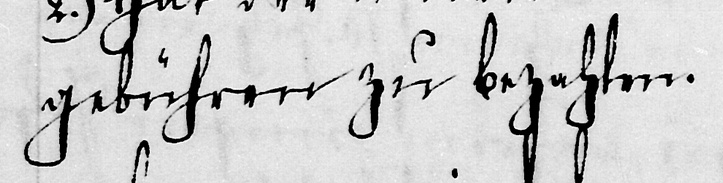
gebühren zu bezahlen.
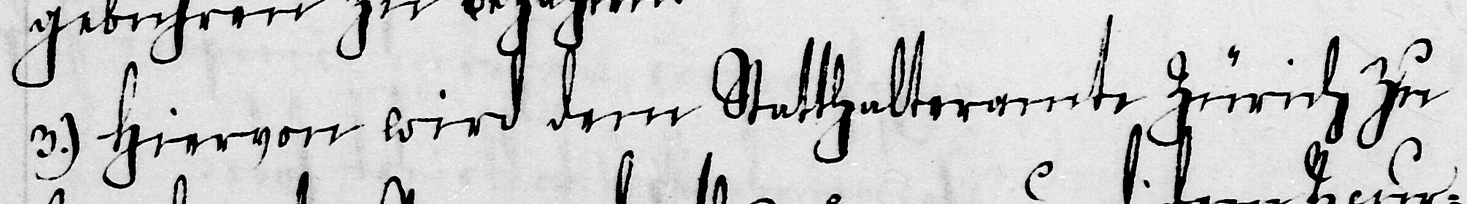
3.) Hiervon wird dem Statthalteramte Zürich zu
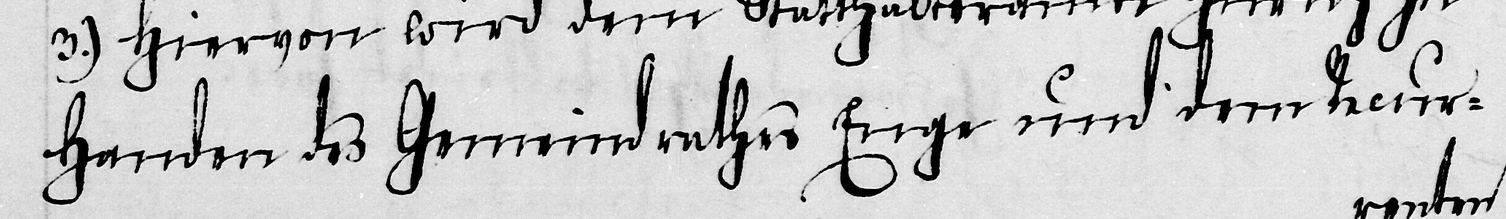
Handen des Gemeindrathes Enge und dem Recur-
